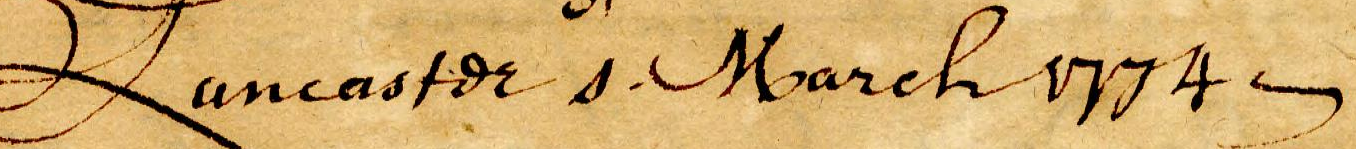Lancaster 1^st March 1774-
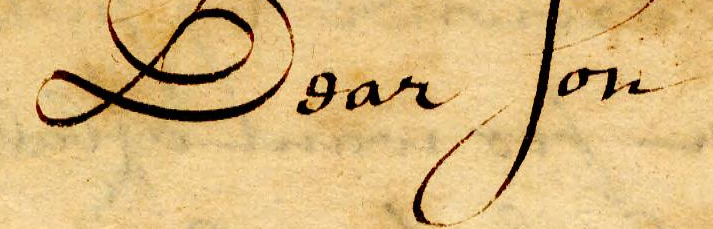Dear Son
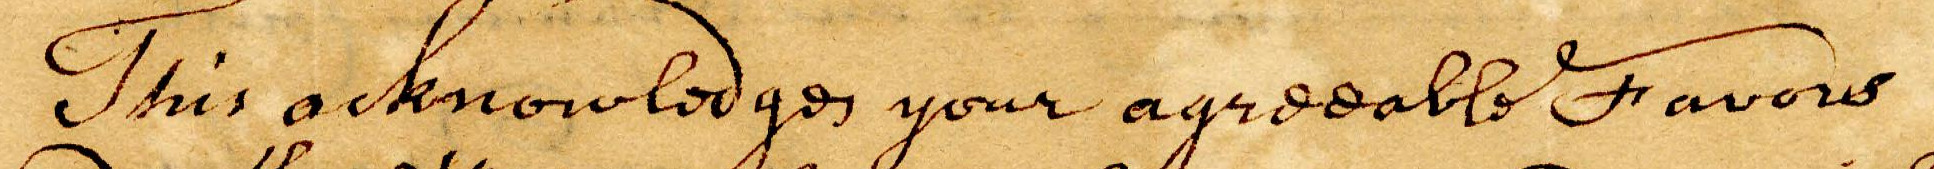This acknowledges your agreeable Favors
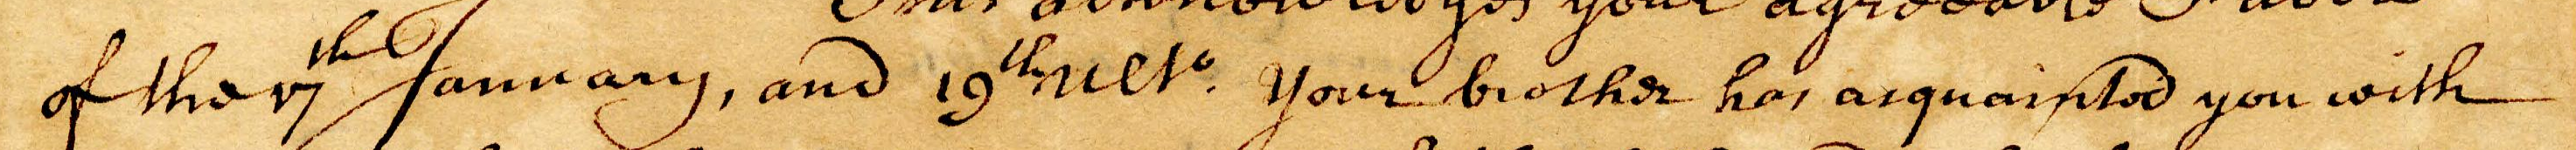of the 17^th January, and 19^th ult^o. Your brother has acquainted you with
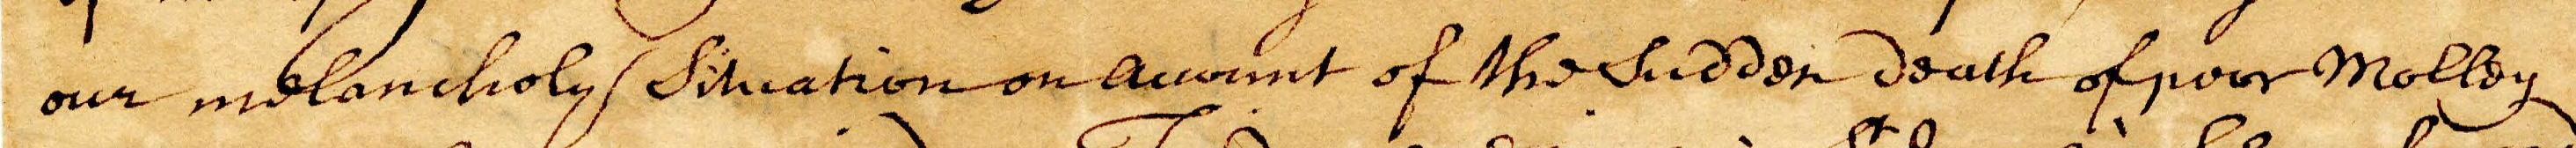our melancholy situation on account of the sudden death of our Molley
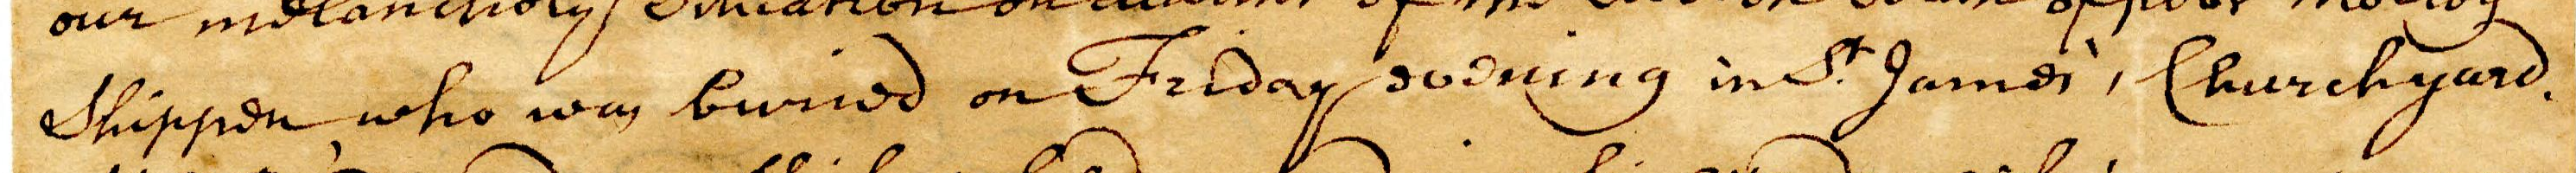Shippen, who was buried on Friday evening in S^t. James's Churchyard.
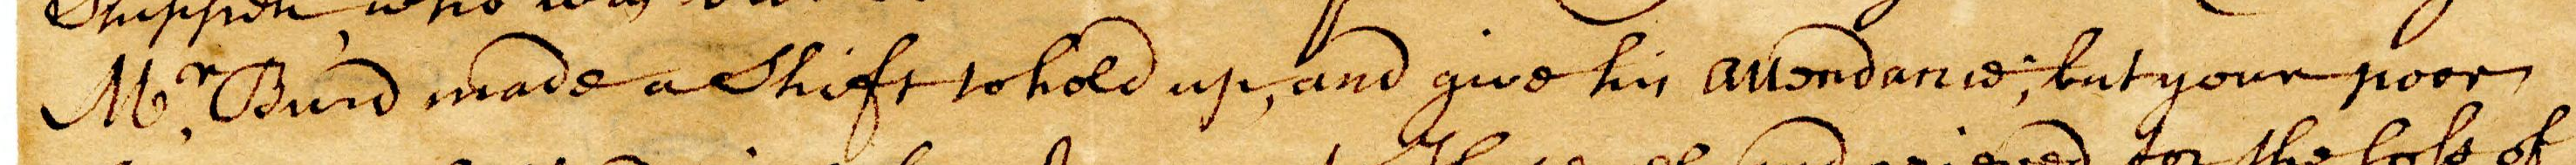M^r. Burd made a shift to hold up, and give his attendance; but your poor
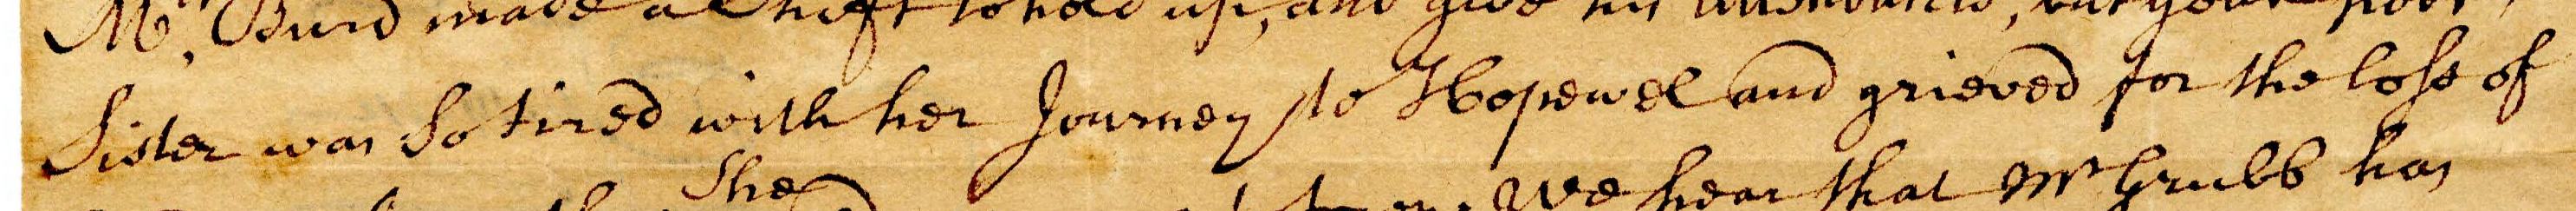sister was so tired with her Journey to Hopewel and grieved for the loss of
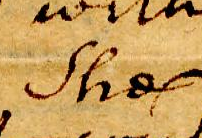She
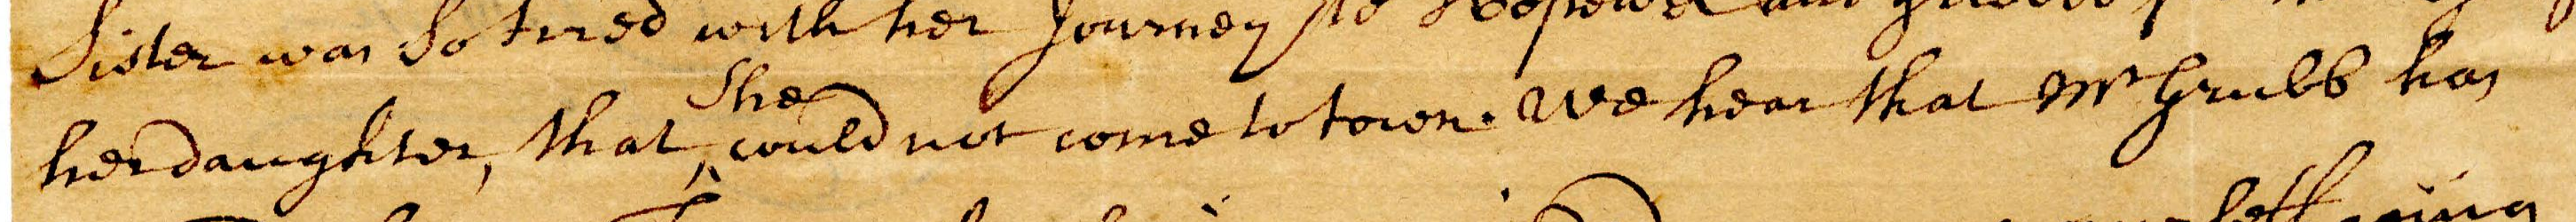her daughter, that ^ could not come to town. We hear that M^r Grulb has
